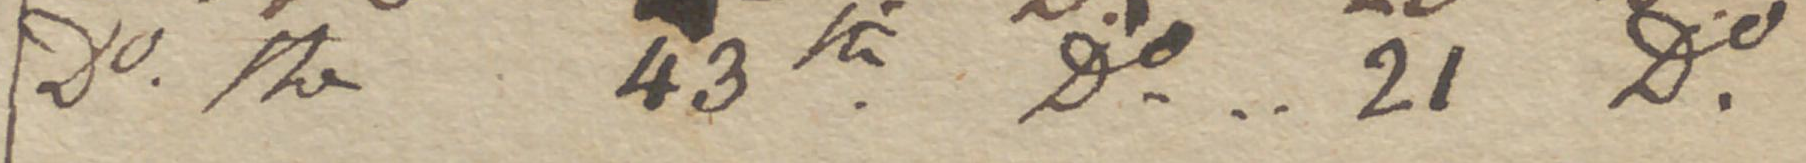D^o. the 43^th. D^o... 21 D^o.
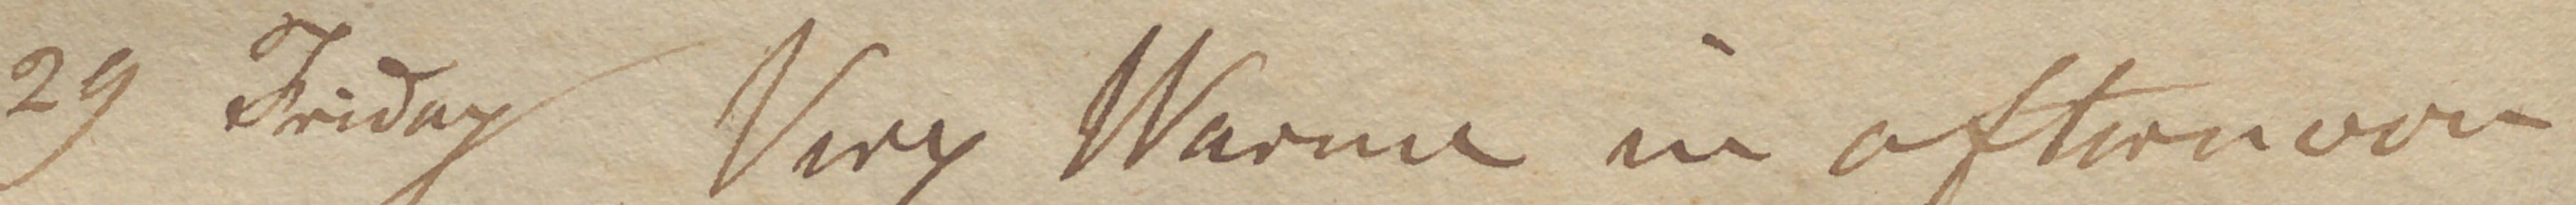29 Friday Very Warme in afternoon
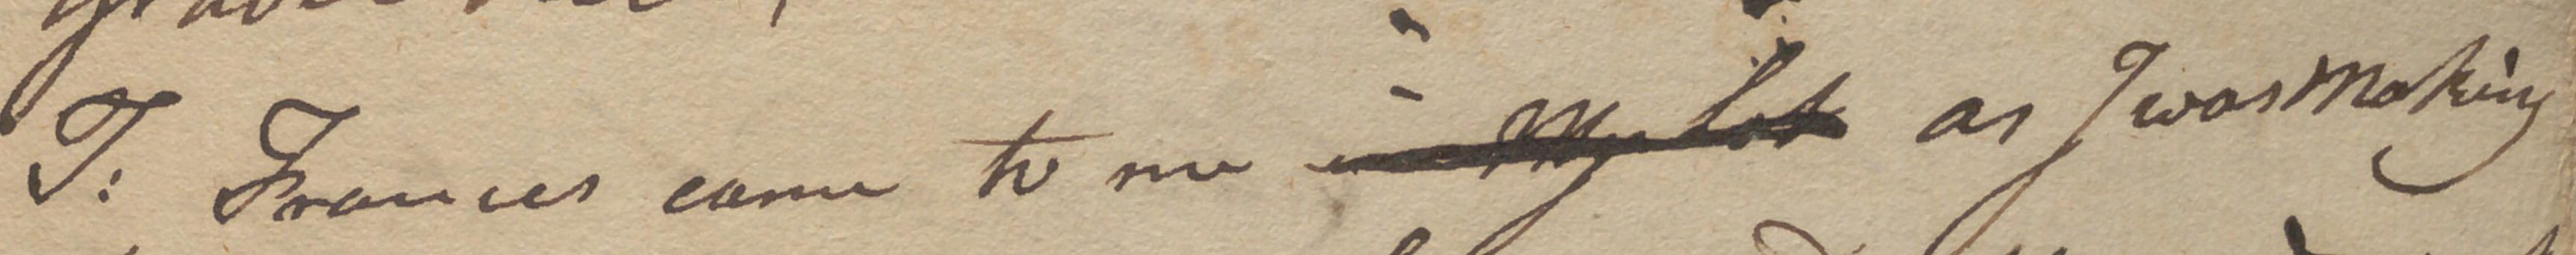T: Frances came to me [in My Lot] as I was making
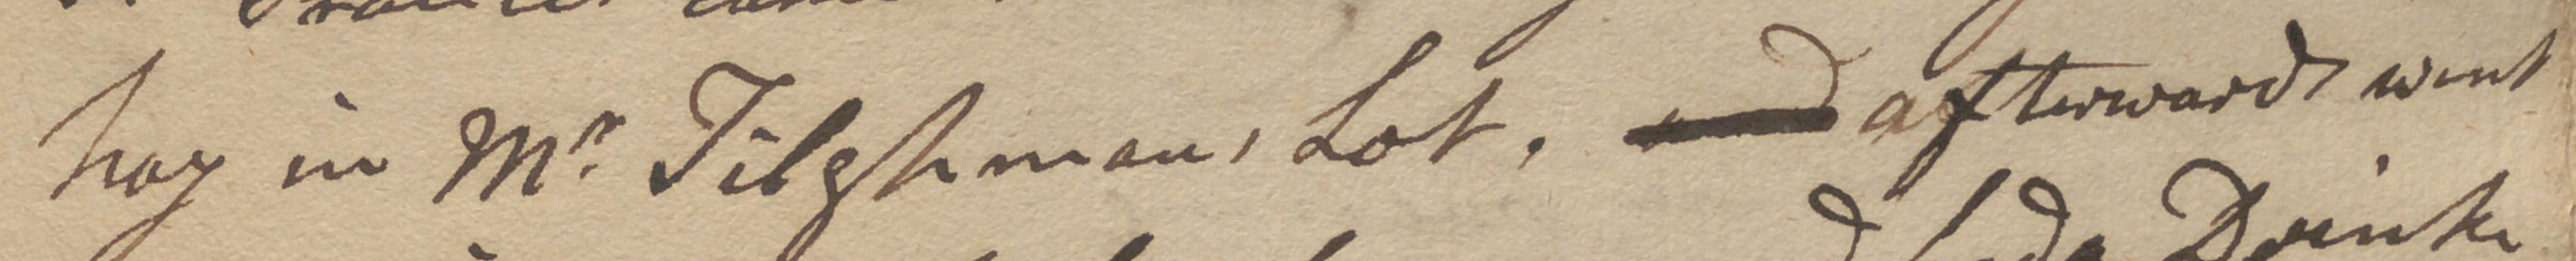hay in M^r. Tilghmans Lot, [and] afterwards went
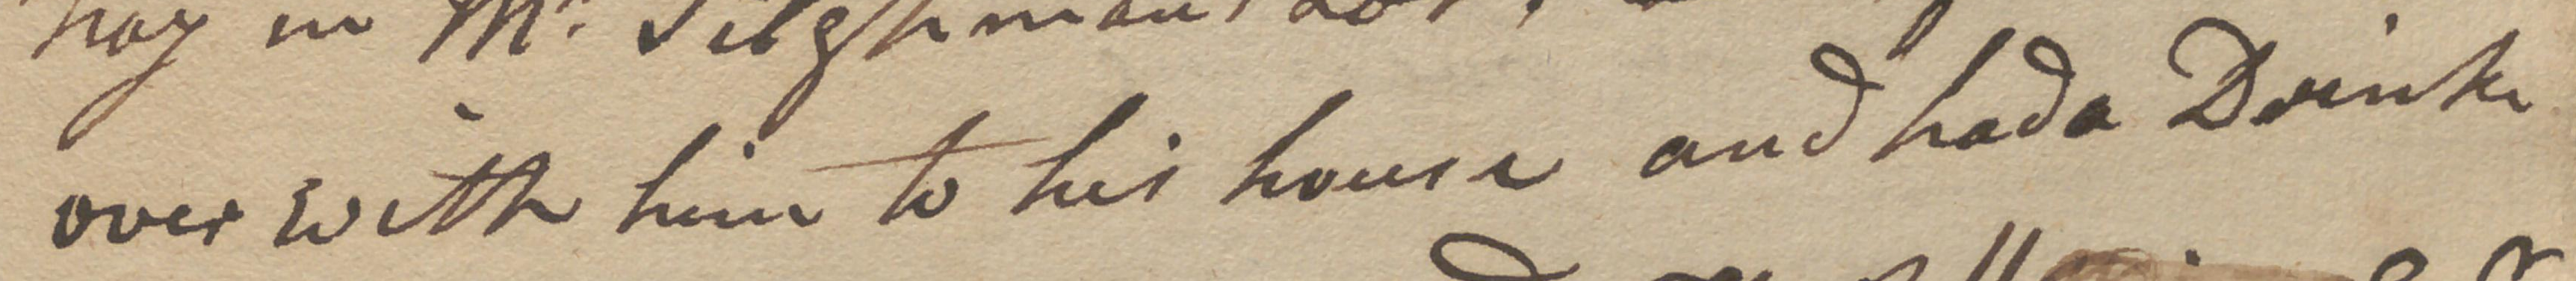over with him to his house and had a Drink
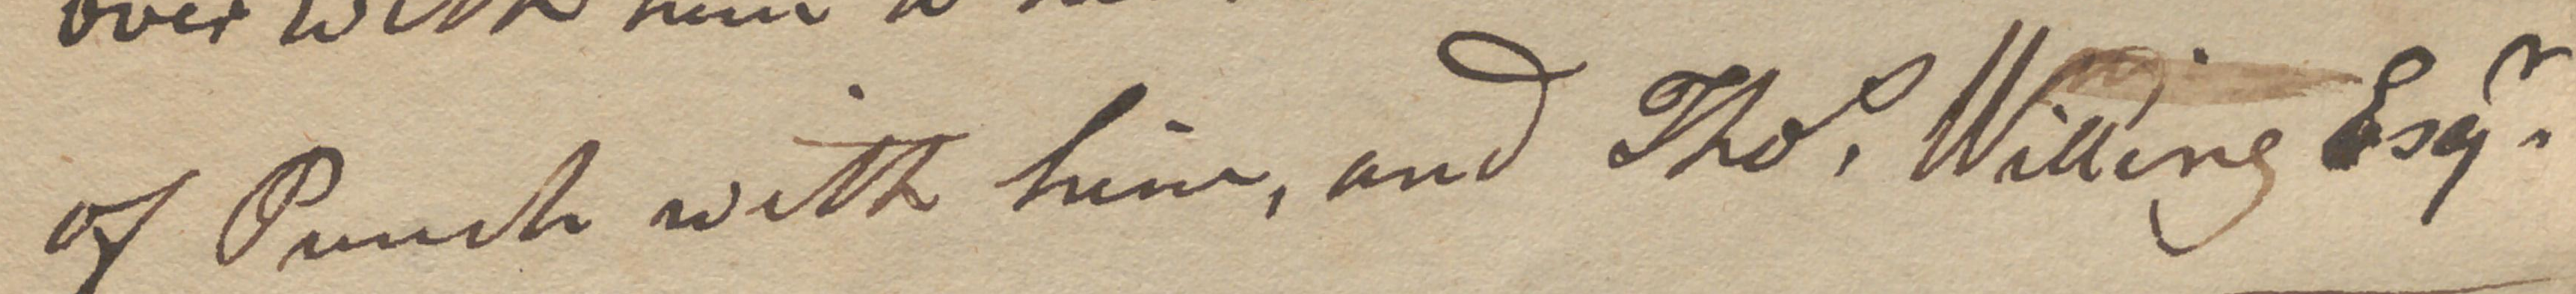of Punch with him, and Tho^s. Willing Esq^r.
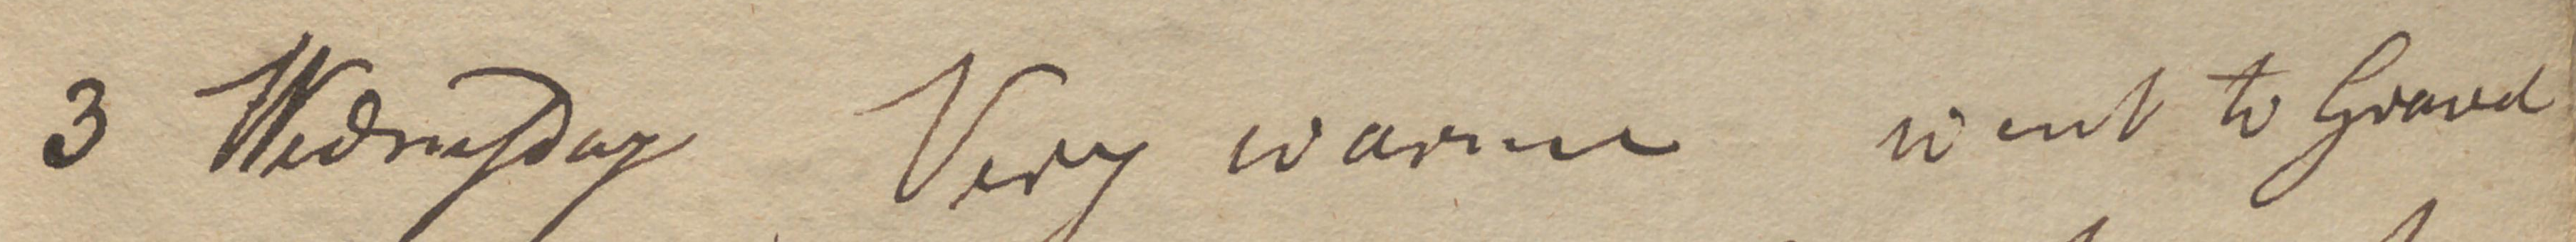3 Wednesday Very warme went to Gravel
